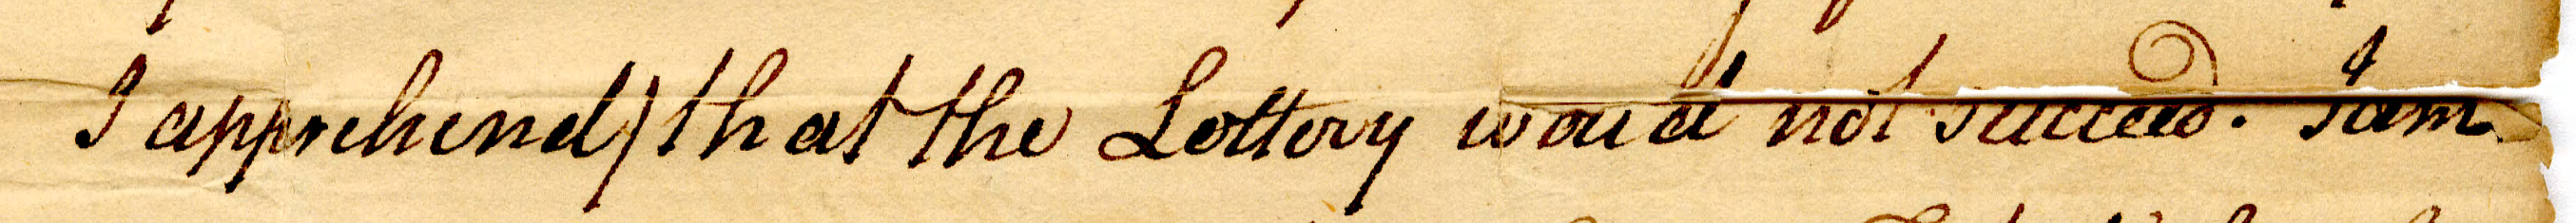I apprehend) that the Lottery woud not succeed. I am
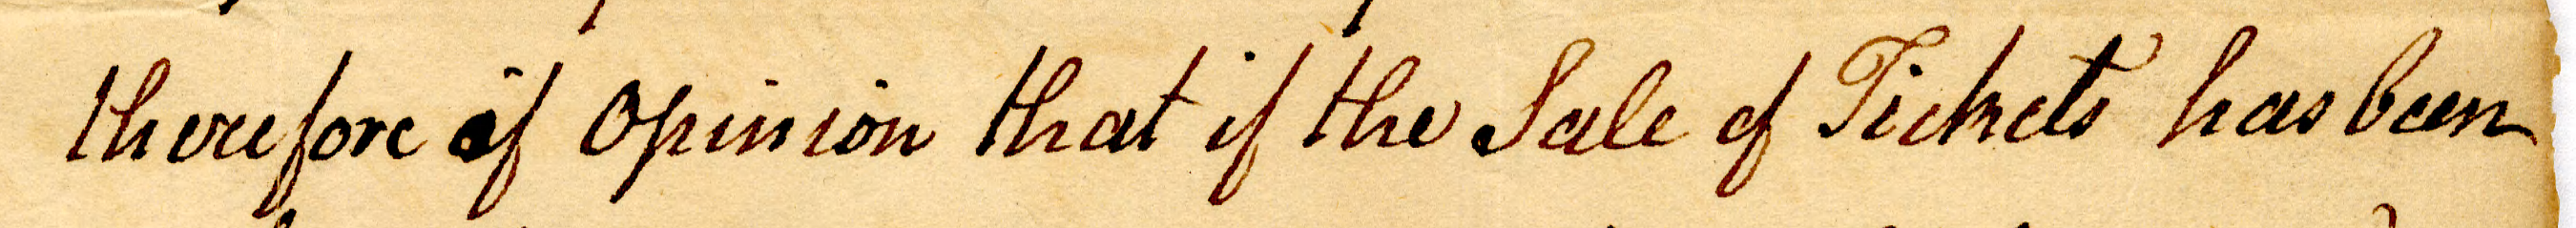therefore of opinion that if the Sale of Tickets has been
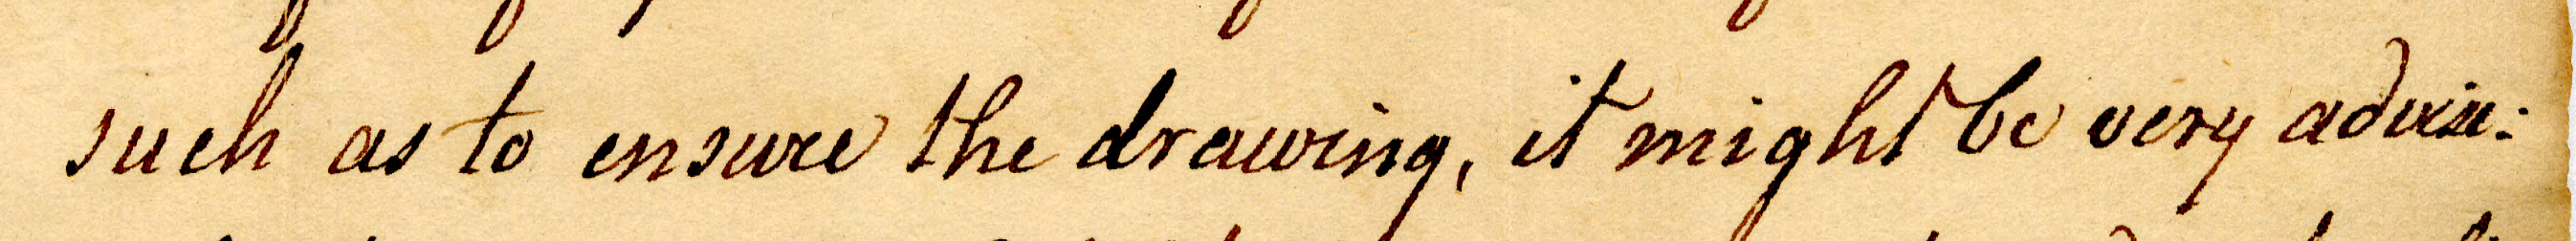such as to ensure the drawing, it might be very advise-
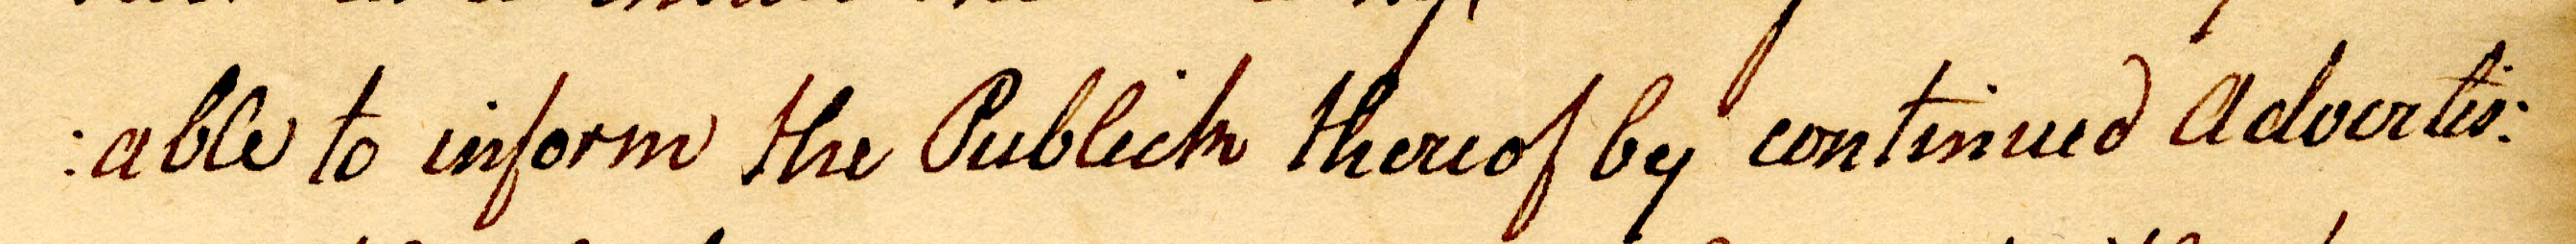-able to inform the Publick thereof by continued Advertis-
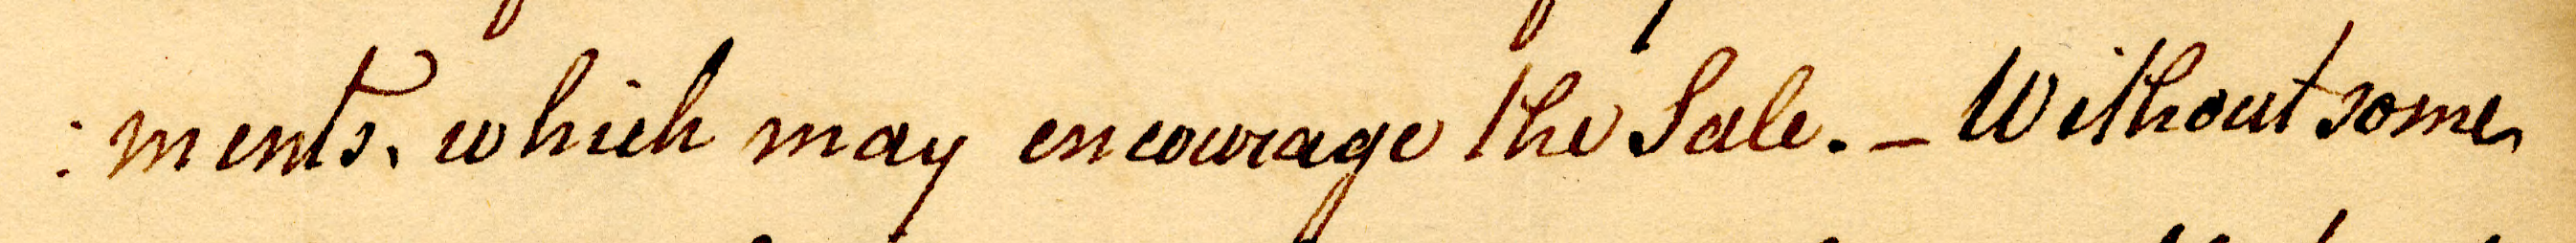-ments which may encourage the Sale.- Without some
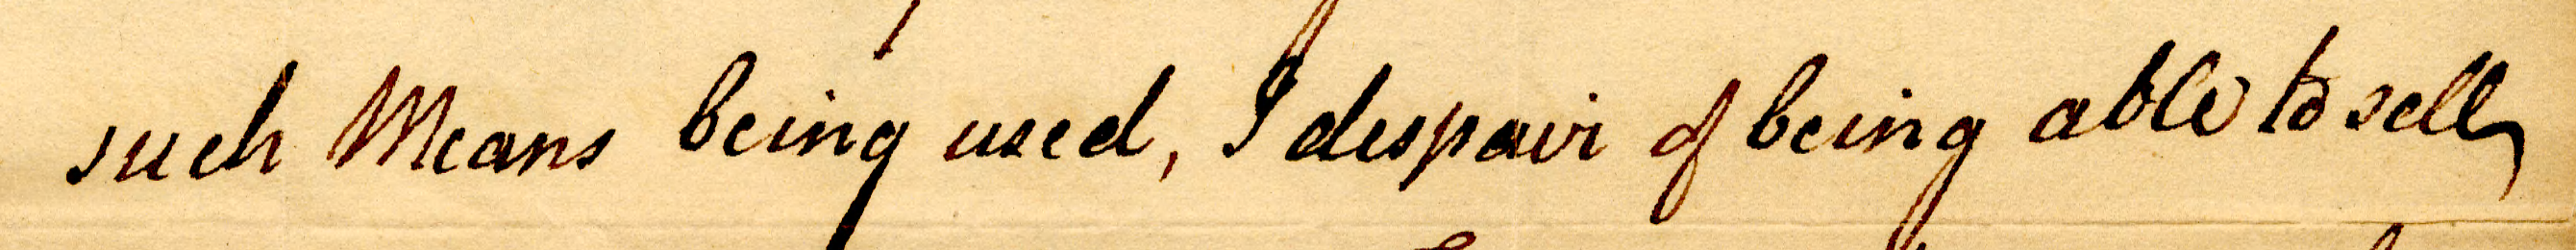such Means being used, I despair of being able to sell
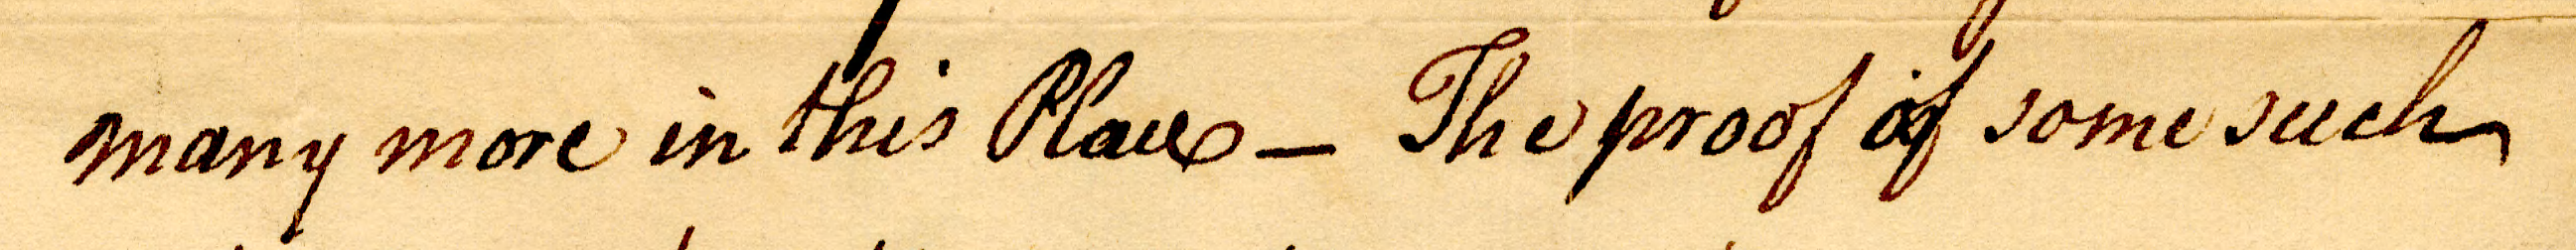many more in this Place- The proof of some such
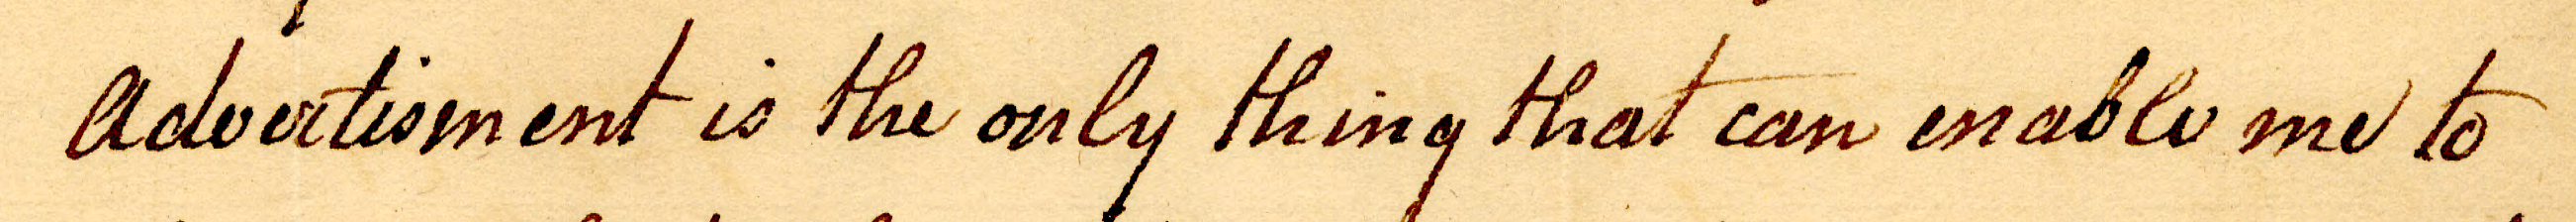Advertisment is the only thing that can enable me to
